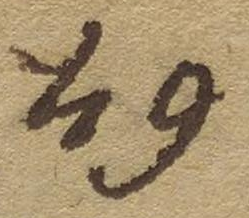49
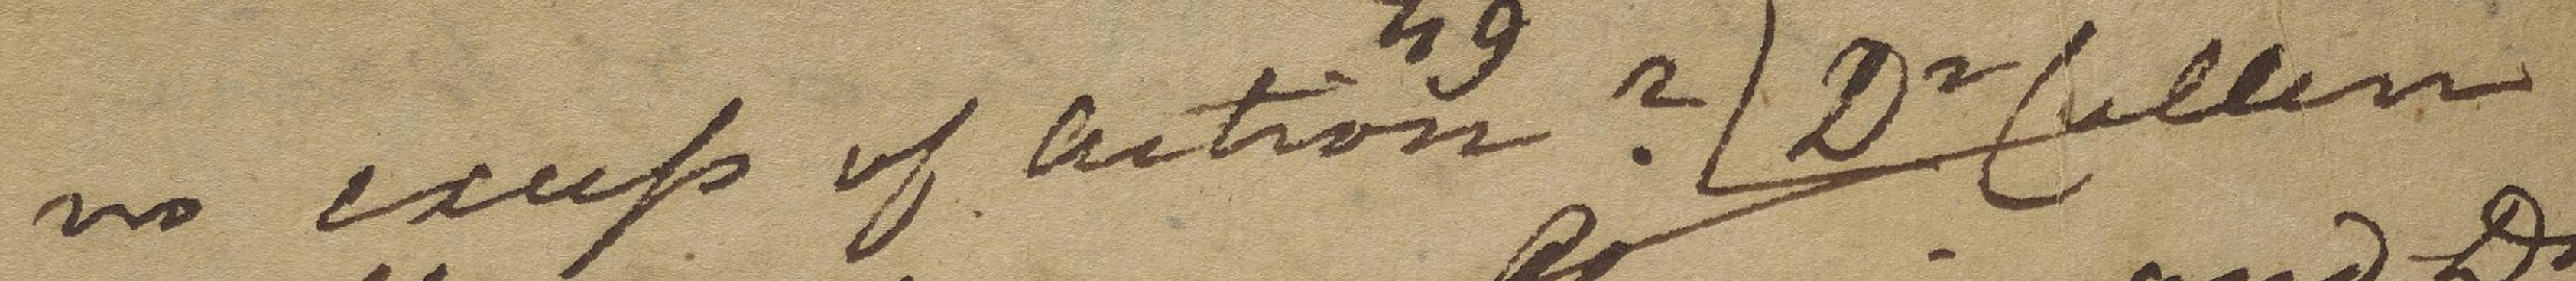no excess of action? (D^r Cullen
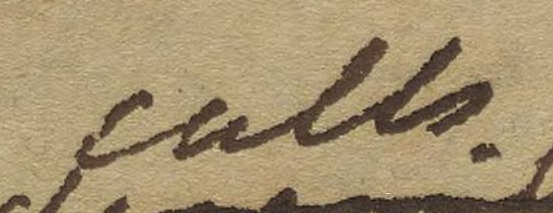calls
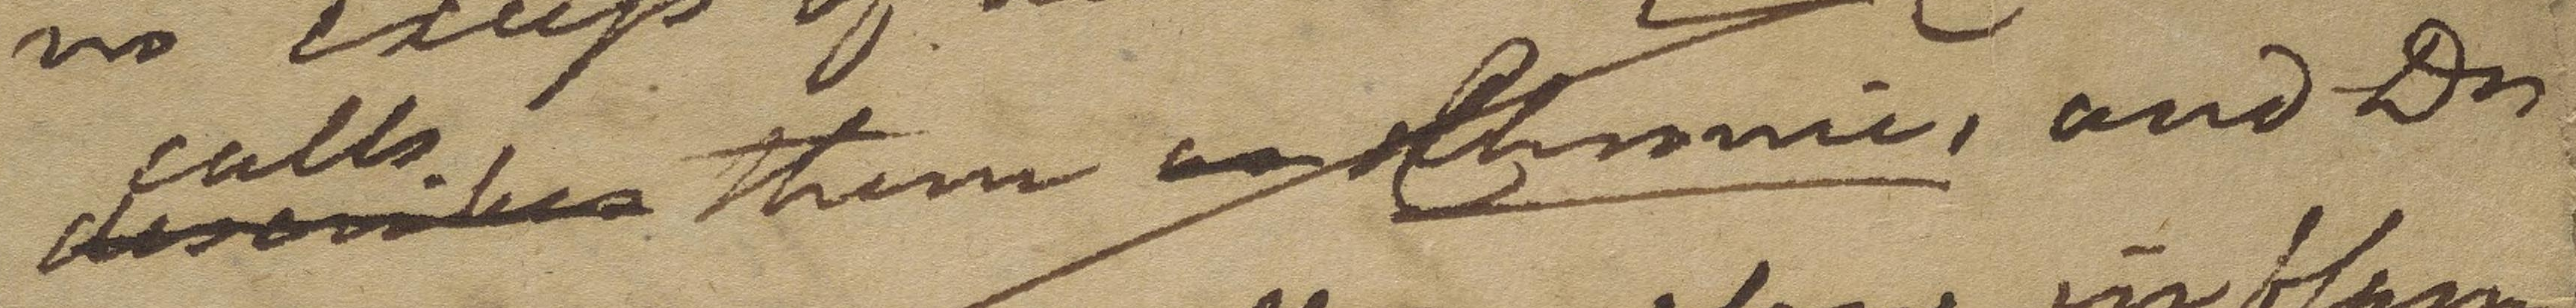[describes] them an Chromi, and D^r
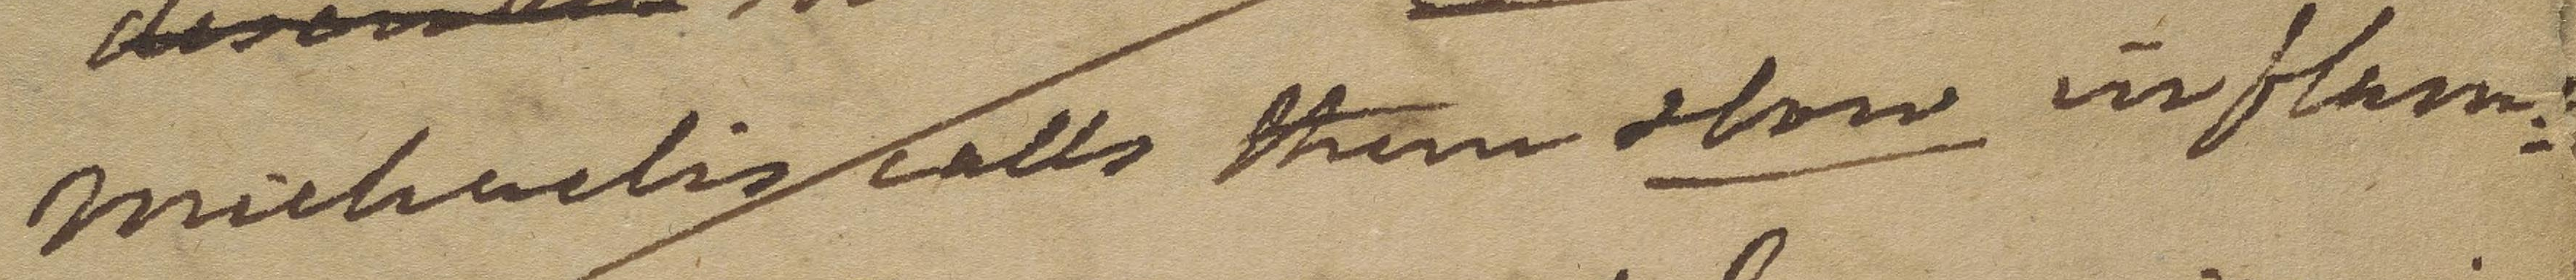Michaelis calls them slow inflam-
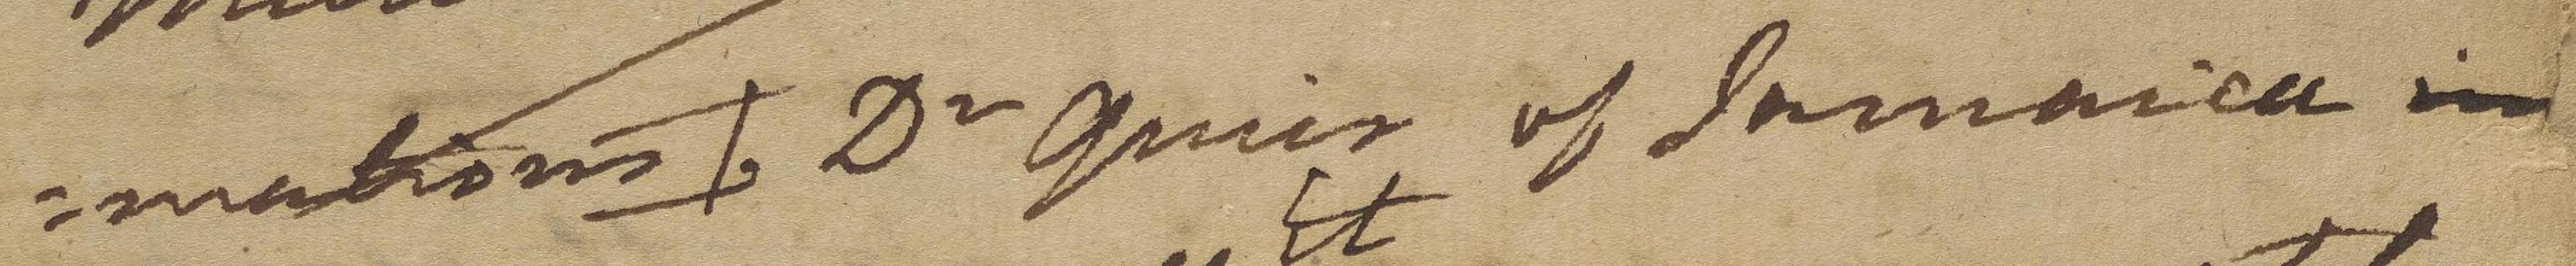-mations.) D^r Grier of Jamaica [in]
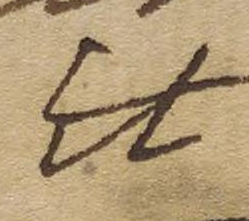it
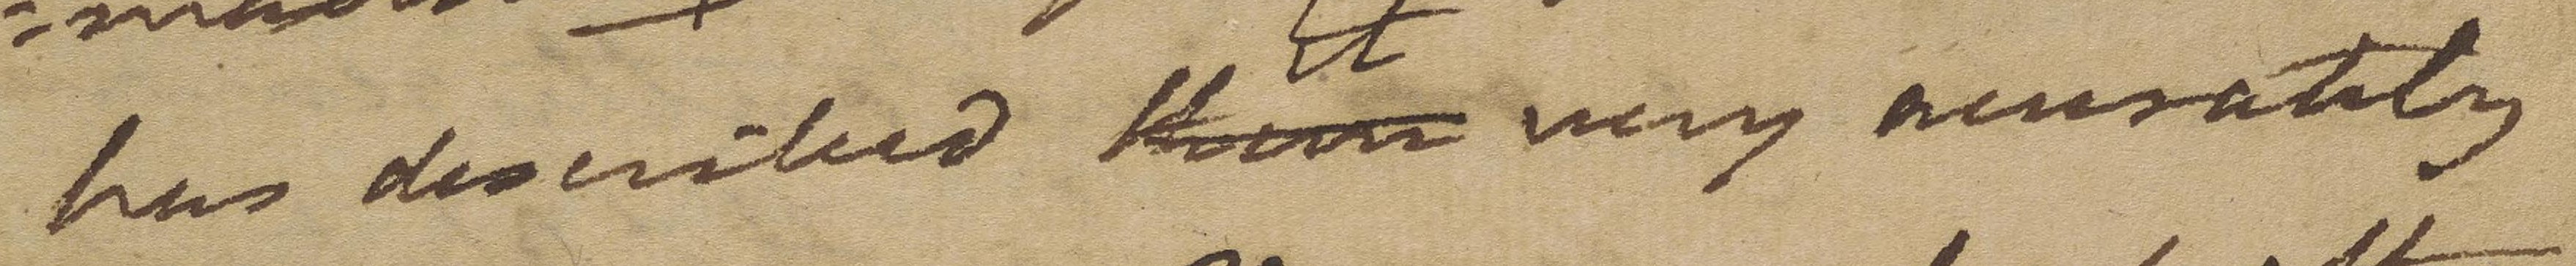has described [them] very accurately
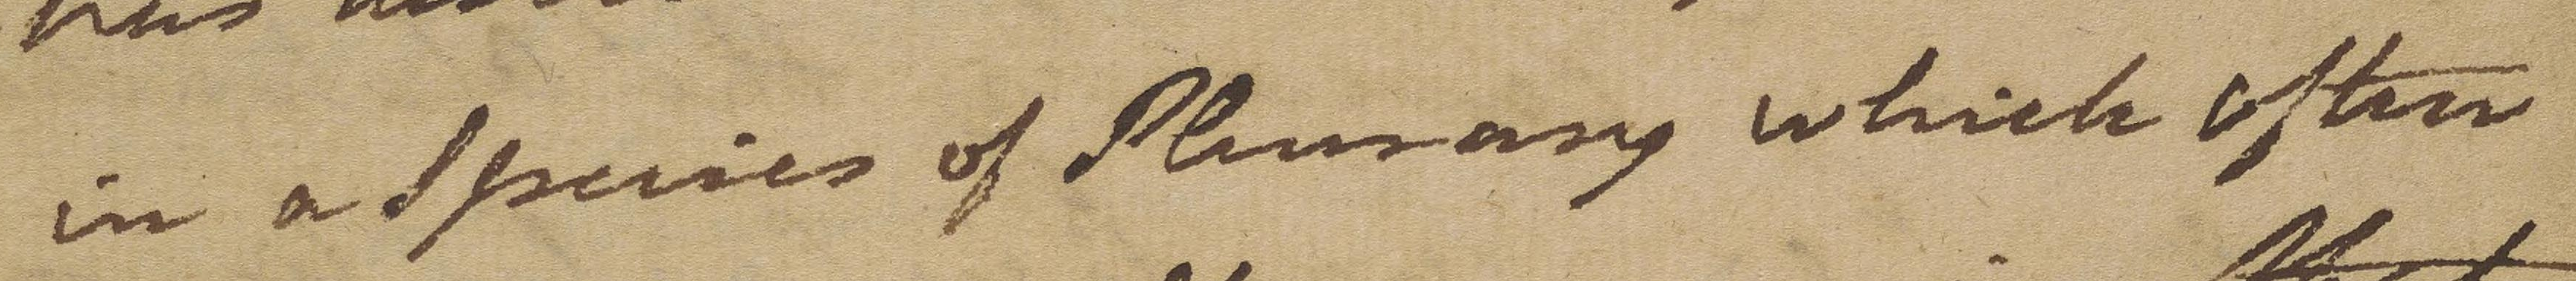in a Species of Pleurasy which often
